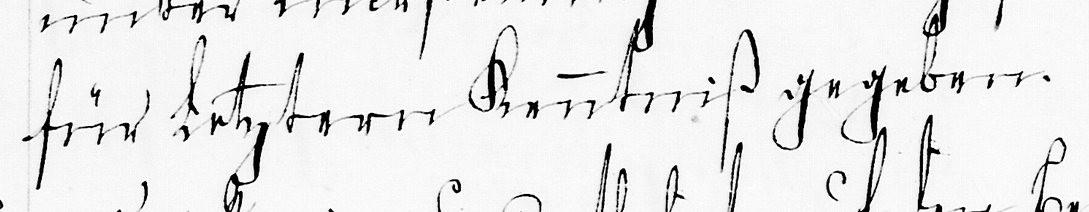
für Letztern Kenntniß gegeben.
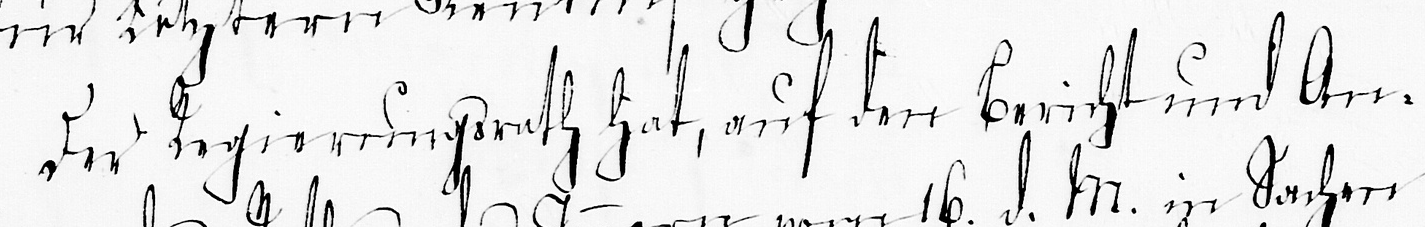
Der Regierungsrath hat, auf den Bericht und An¬
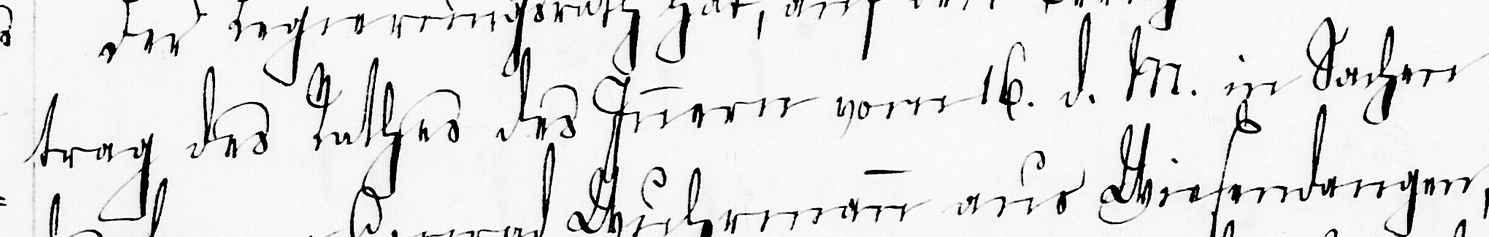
trag des Rathes des Innern vom 16. d. M. in Sachen
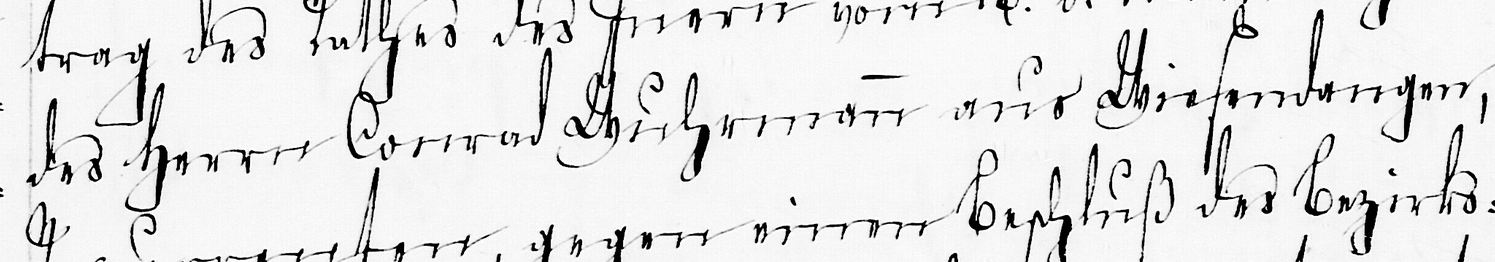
des Herrn Conrad Wuhrmann aus Wiesendangen,
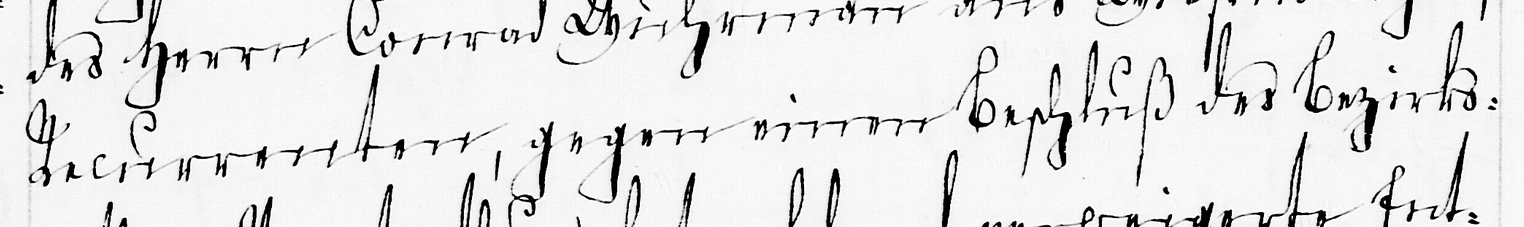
Recurrenten, gegen einen Beschluß des Bezirks¬
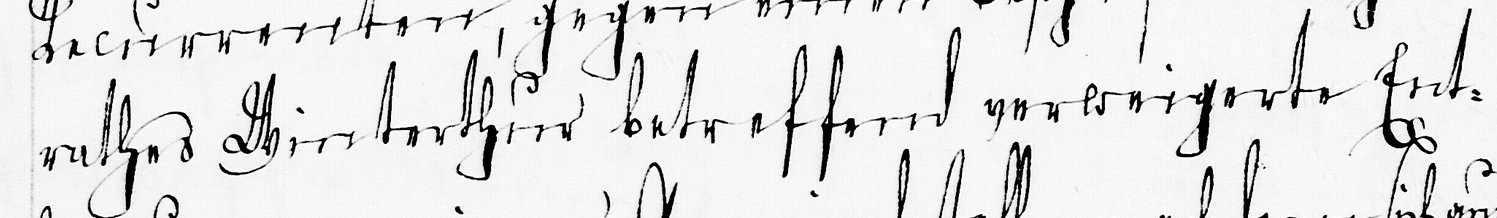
rathes Winterthur betreffend verweigerte Ent¬
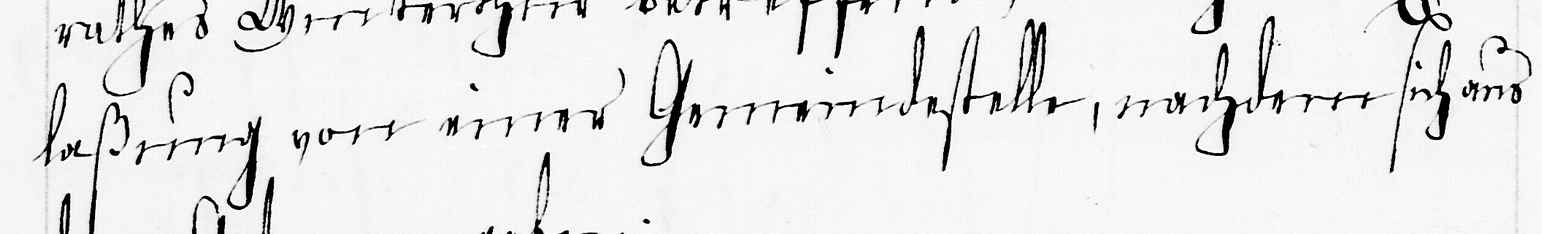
laßung von einer Gemeindestelle, nachdem sich aus
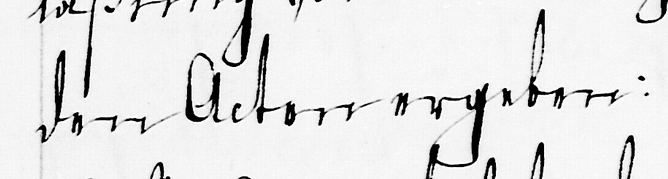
den Acten ergeben:
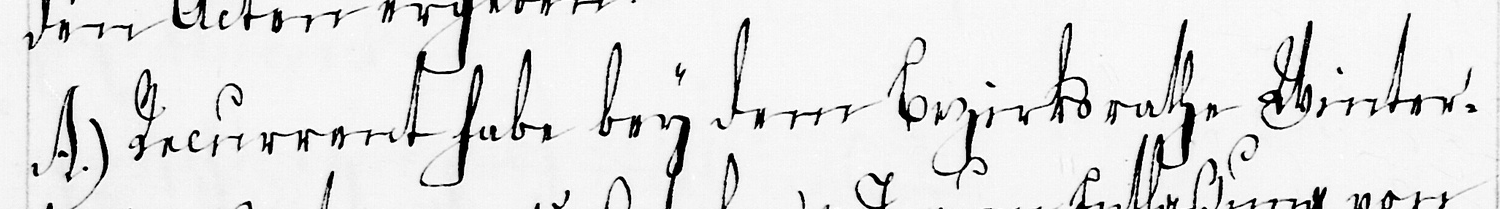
A.) Recurrent habe bey dem Bezirksrathe Winter¬
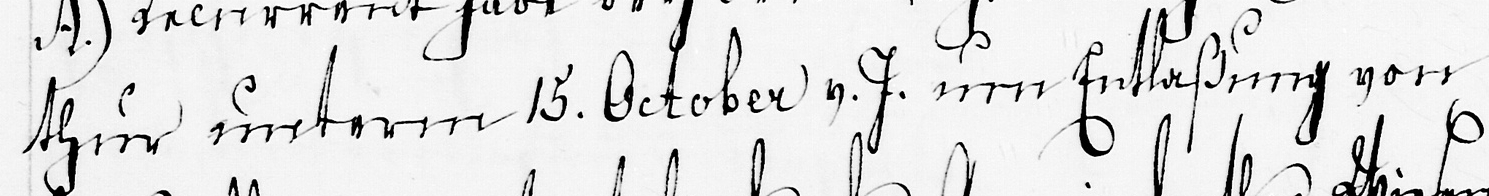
thur unterm 15. October v. J. um Entlaßung von
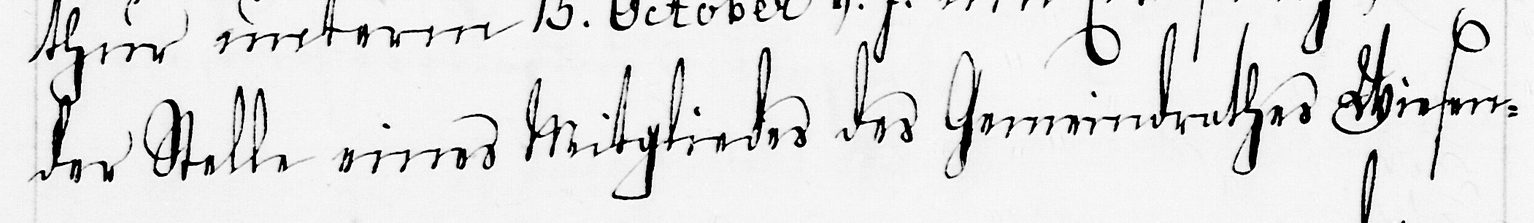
der Stelle eines Mitgliedes des Gemeindrathes Wiesen-
